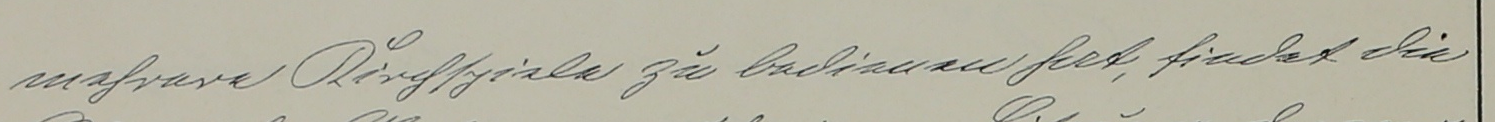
mehrere Kirchspiele zu bedienen hat, findet die
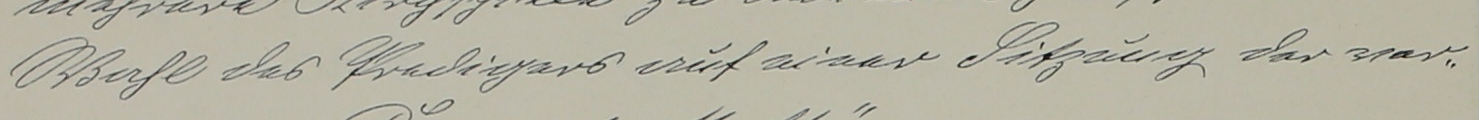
Wahl des Predigers auf einer Sitzung der ver-
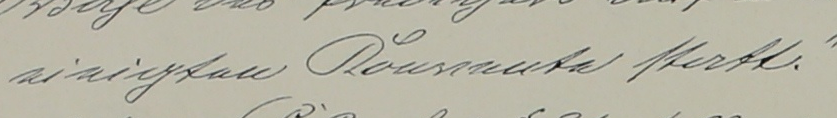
einigten Konvente statt.“
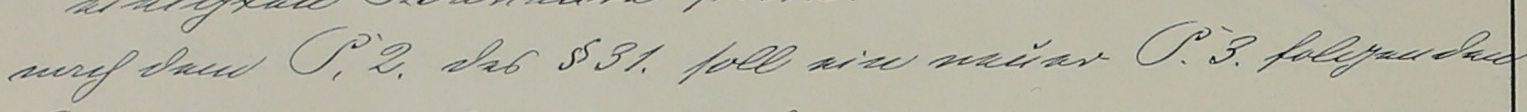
nach dem P. 2. des § 31. soll ein neuer P. 3. folgenden
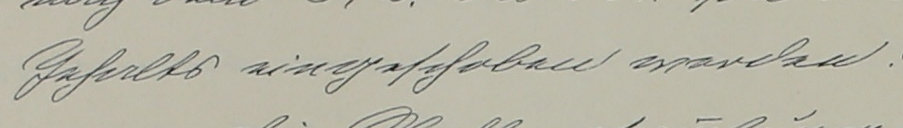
Inhalts eingeschoben werden:
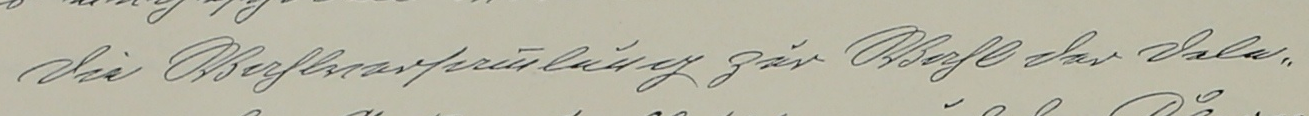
„Die Wahlversammlung zur Wahl der Dele-
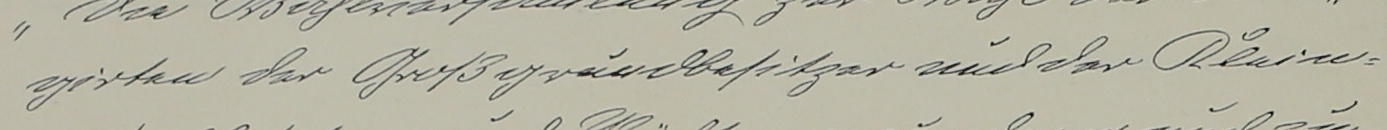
girten der Großgrundbesitzer und der Klein-
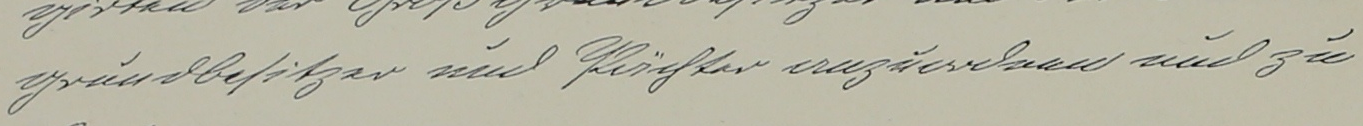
grundbesitzer und Pächter anzuordnen und zu
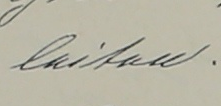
leiten.
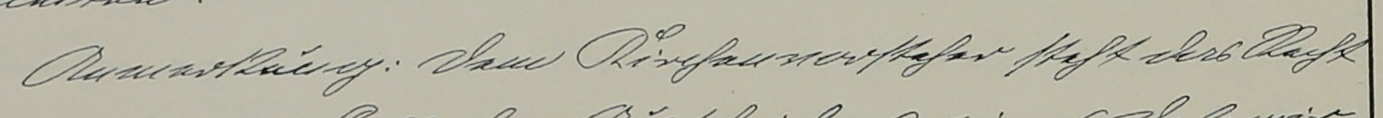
Anmerkung: Dem Kirchenvorsteher steht das Recht
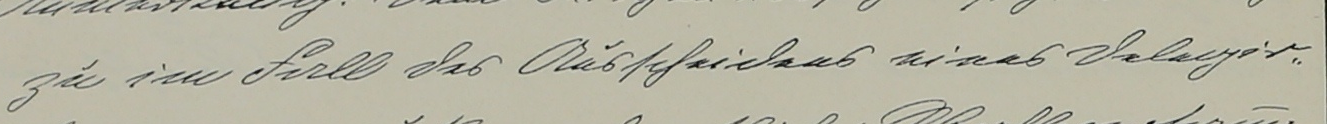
zu im Fall des Ausscheidens eines Delegir-
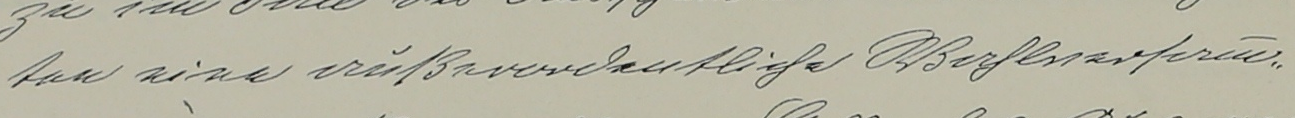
ten eine außerordentliche Wahlversamm-
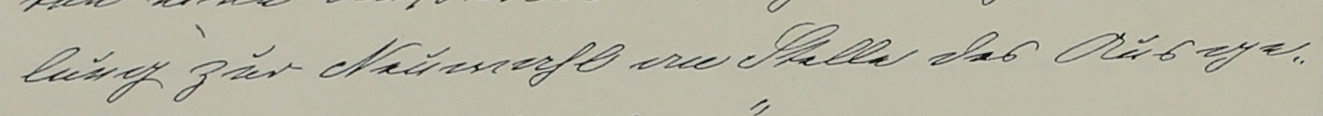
lung zur Neuwahl an Stelle des Ausge-
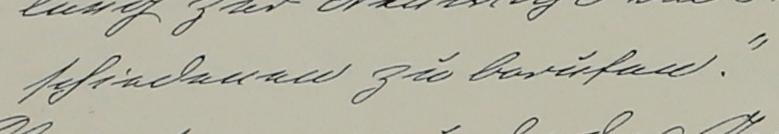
schiedenen zu berufen.“
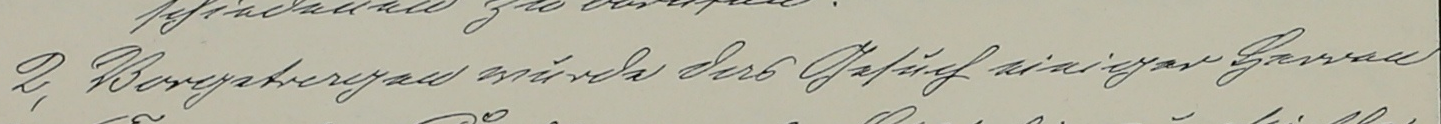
2. Vorgetragen wurde das Gesuch einiger Herren
